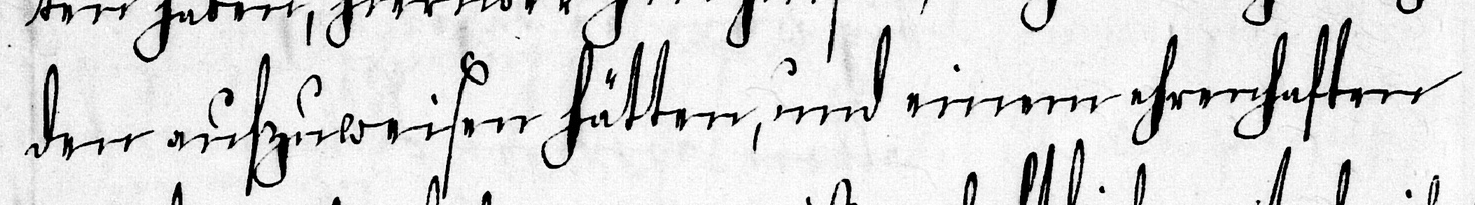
den aufzuweisen hätten, und einem ehrenhaften
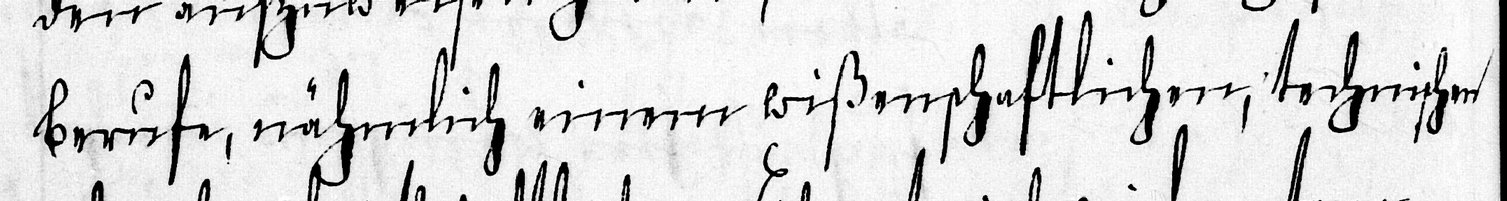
Berufe, nähmlich einem wißenschaftlichen, technischen
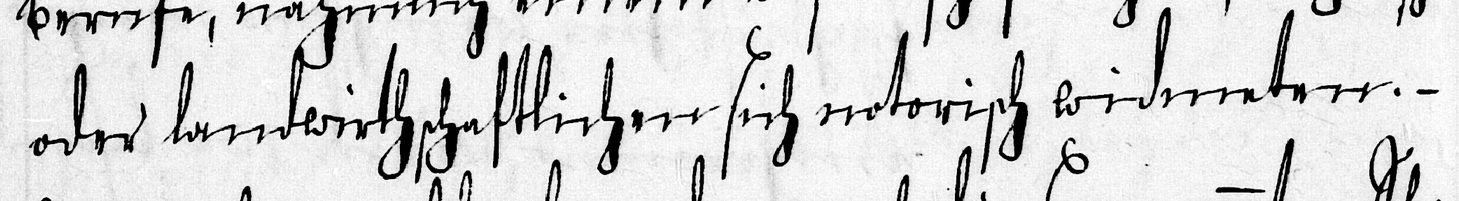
oder landwirthschaftlichen sich notorisch widmeten.
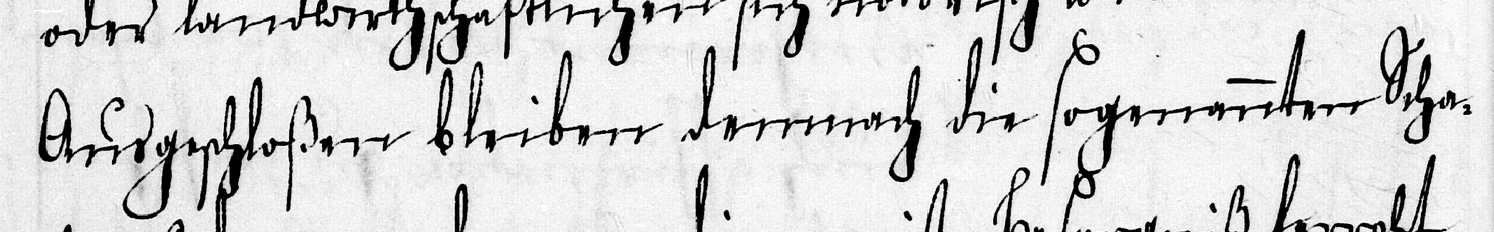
Ausgeschloßen bleiben demnach die sogenannten Scha¬
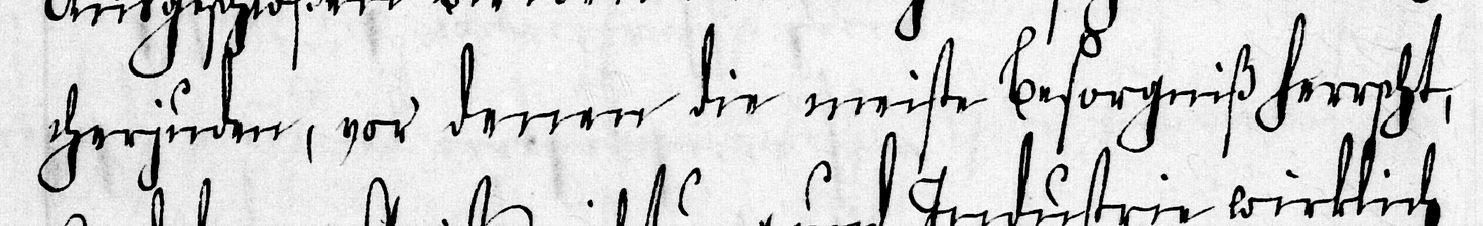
cherjuden, von denen die meiste Besorgniß herrscht,
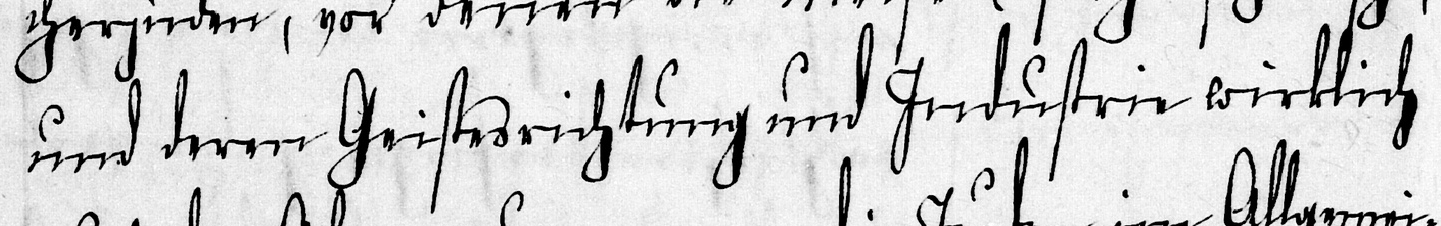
und deren Geistesrichtung und Industrie wirklich
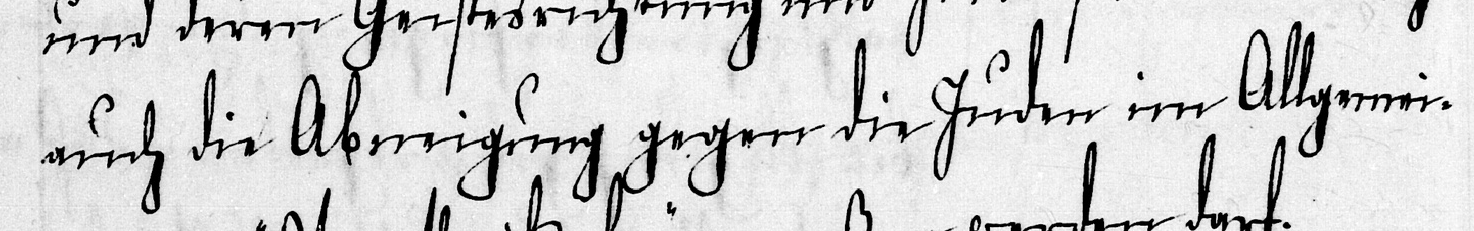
auch die Abneigung gegen die Juden im Allgemei¬
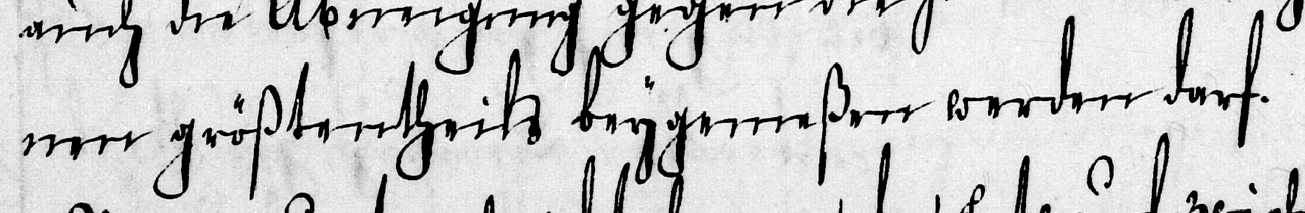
nen größtentheils beygemeßen werden darf.
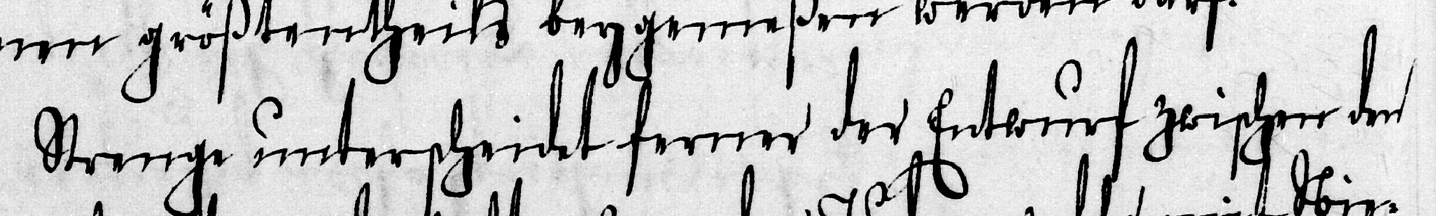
Strenge unterscheidet ferner der Entwurf zwischen den
